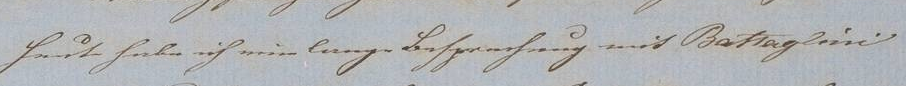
Heute habe ich eine lange Besprechung mit Battaglini
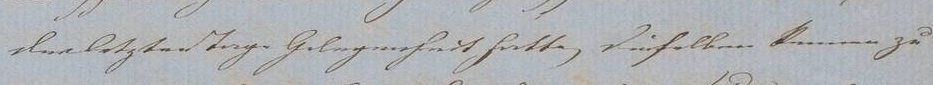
der letzten Tage Gelegenheit hatte, dieselben kennen zu
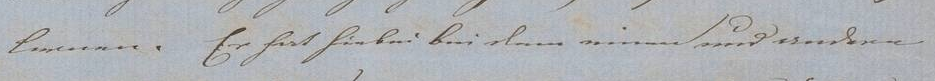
lernen. Er hat hiebei bei dem einen und andern
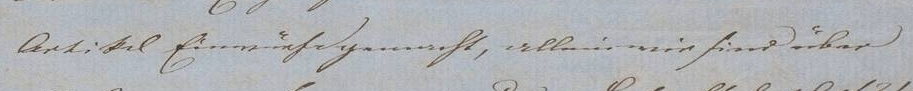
Artikel Einwürfe gemacht, allein wir sind über
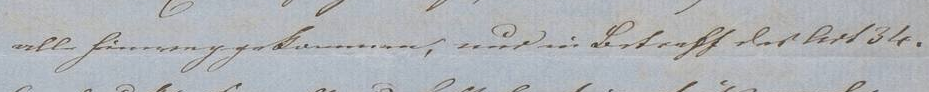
alle hinweggekommen, nur in Betreff des Art 34.
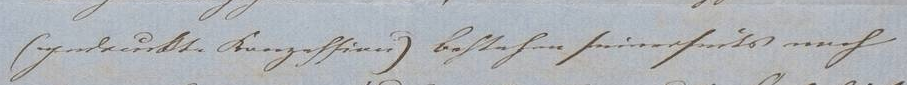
(gedruckte Konzession) bestehen seinerseits noch
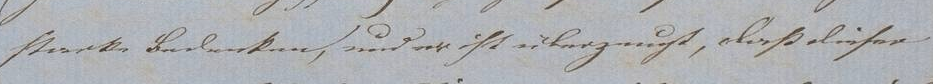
starke Bedenken, und er ist überzeugt, daß dieser
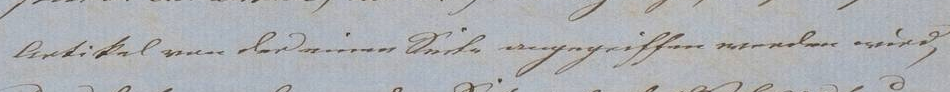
Artikel von der einen Seite angegriffen werden wird,
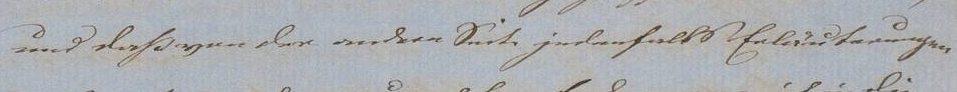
und daß von der andern Seite jedenfalls Erläuterungen
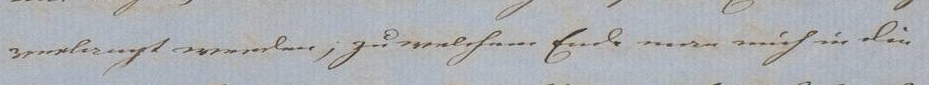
verlangt werden, zu welchem Ende man mich in die
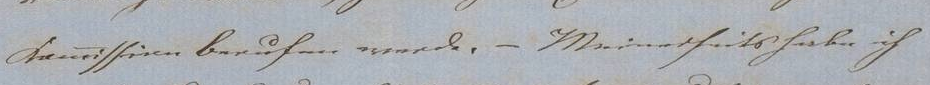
Kommission berufen werde. – Meinerseits habe ich
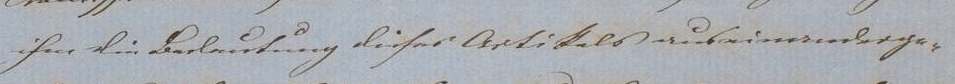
ihm die Bedeutung dieses Artikels auseinanderge-
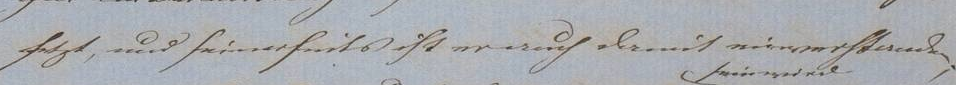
setzt, und seinerseits ist er auch damit einverstanden,
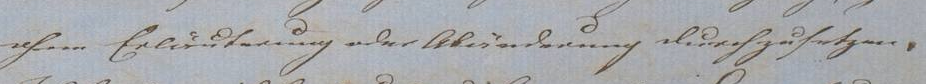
ohne Erläuterung oder Abänderung durchzusetzen.
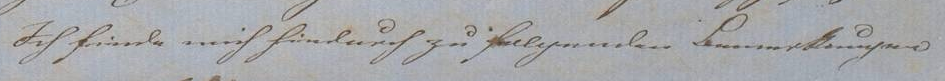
Ich finde mich hiedurch zu folgenden Bemerkungen
